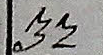32
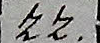22
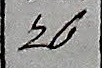26
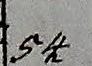54
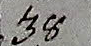38
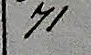71
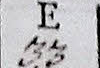33
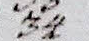34
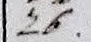26
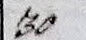30
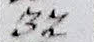32
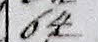64
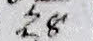28
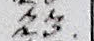23
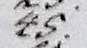45
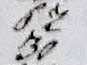30
